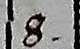8
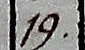19
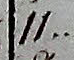11
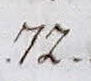72
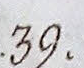39
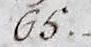65
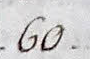60
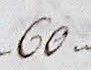60
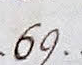69
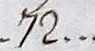72
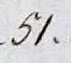51
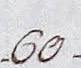60
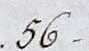56
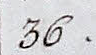36
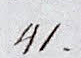41
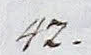42
